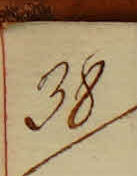38
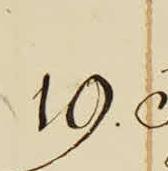19.
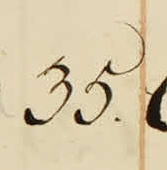35.
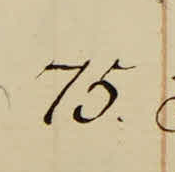75.
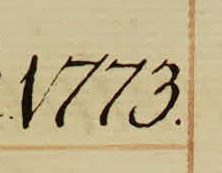1773.
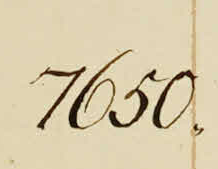7650
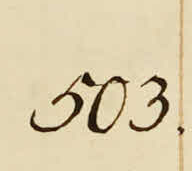503
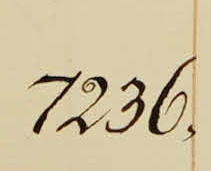7236
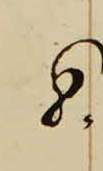8
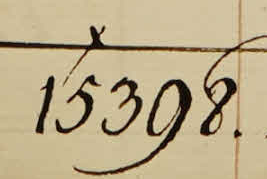15398.
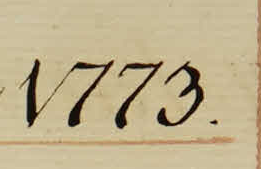1773.
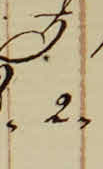15398, 2, 10.
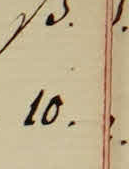15398, 2, 10.
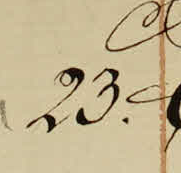23.
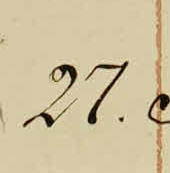27.
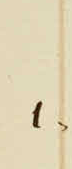1
